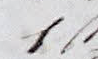1
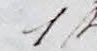1
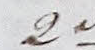2
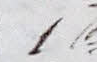1
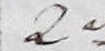2
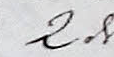2
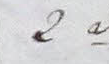2
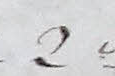2
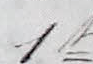1
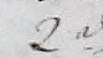2
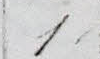1
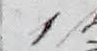1
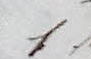1
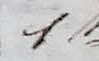1
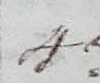4
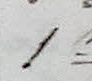1
